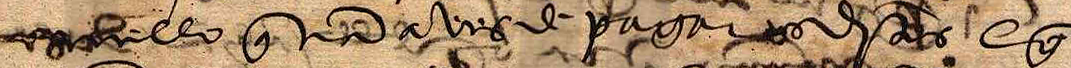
mello q̄ nā aves de pagar os drtos e q̄
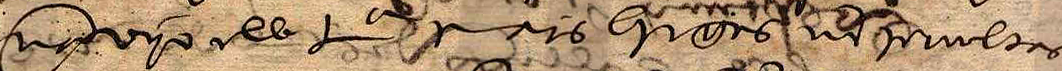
nā vyo elle ta mais brigas nē reuoltas
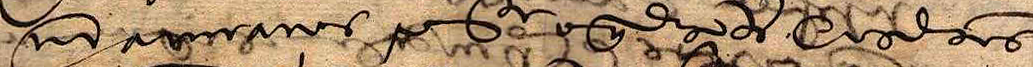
ē ameaços somte o q̄ dtō te e os dtōs
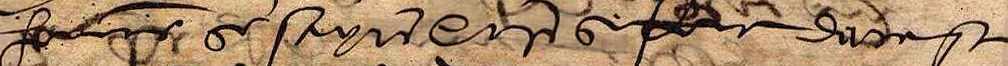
homēs se sayrē e irē se fora da casa
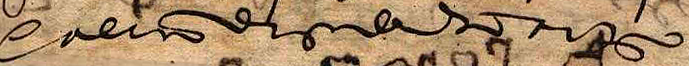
e all nō disse do dtō arto
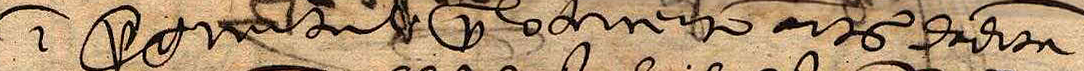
item p̄gumtado p̄lo terceiro arto da dita
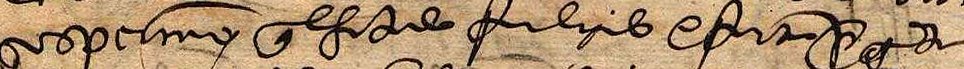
sospeição q̄ lhe todo foi lydo e feyta p̄gūta
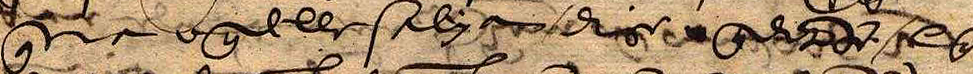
q̄ era o q̄ delle sabya / dise o q̄ dito tē / e q̄
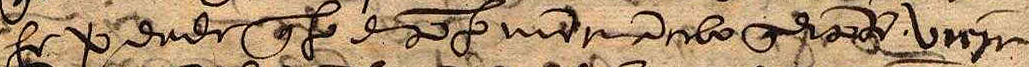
he ꝟdade q̄ ho dito homē mācebo q̄ dito tē viera
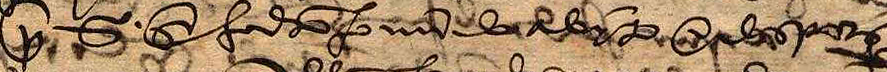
p̄mo sē ho dtō homē do abyto e despois
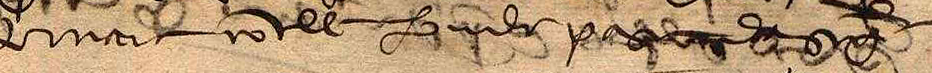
tornara cō elle honde pasa da segda
